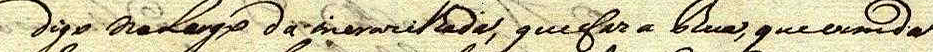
digo no Largo da merazilhada, que faz a Rua, que vem da
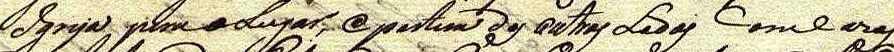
Igreja para o Lugar, e partira dos outros Lados Com cazas
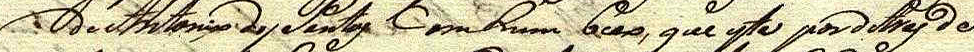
de Antonio das Pontas Com hum beco, que esta por detras de
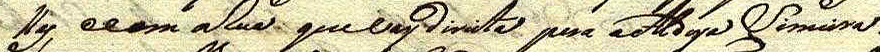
llas, e com a Rua que uay direita para a Aldeya Vimeira:
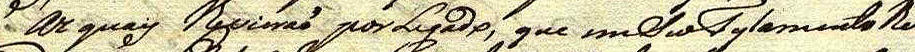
az quais lhe vieraõ por Legado, que em Seo Testamento lhe
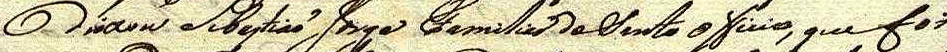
deixou Sebastiaõ Jorge Familiar do Santo officio, que foi
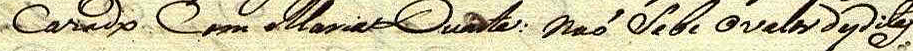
Cazado Com Maria Duarte: naõ sabe o valor das ditas
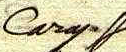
Cazas.//
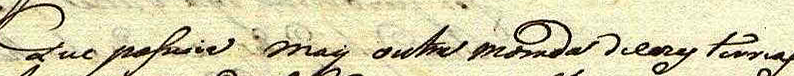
Que passaria mais outra morada de cazas terreas
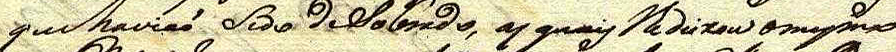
que haviaõ sido de Sobrado, as quais lhe deixou o mesmo
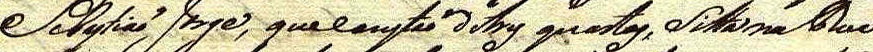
Sebastiaõ Jorge, que constaõ de tres quartos, sitta na Rua
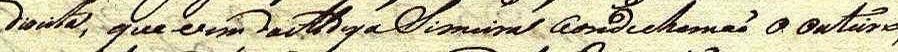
direita, que vem da Aldeya Simeira aonde chamaõ o outeiro,
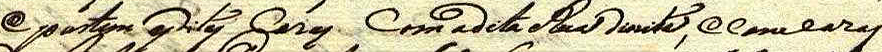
e partem as ditas Cazas Com a dita Rua direita, e com cazas
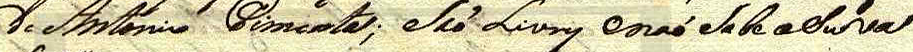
de Antonio Pimenta; Saõ Livres e naõ sabe o seu va
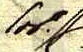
lor.//
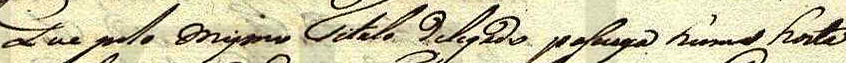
Que pelo mesmo Titulo delegado possuya huma horta
